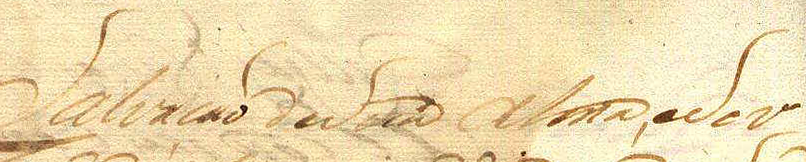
Salvaçaõ de sua alma, e se v
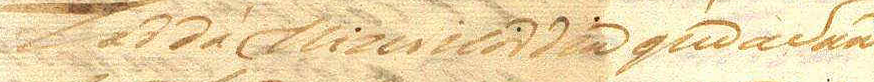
Zar da Mizericordia que a san
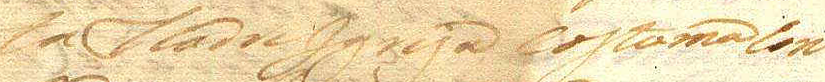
ta Madre Jgreja costuma con
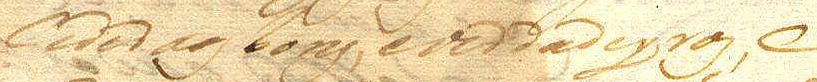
ceder aos bons, e verdadeyros, e
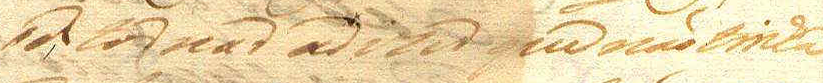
por tornar a dizer que naõ tinha
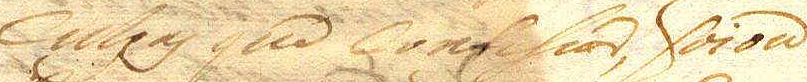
culpas que confessar, foi ou
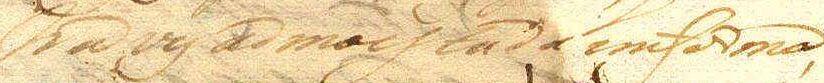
tra ves admoestada em forma,
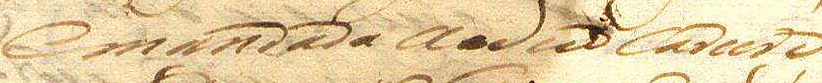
e mandada ao seu carcere,
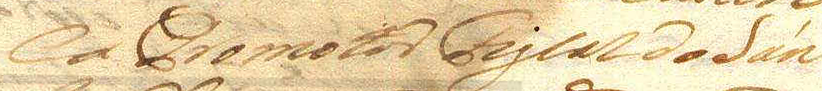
e o Promotor Fiscal do San
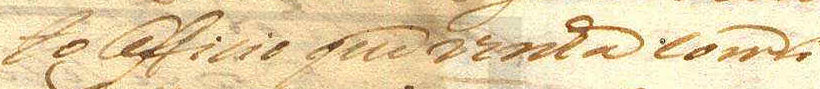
to Officio que venha com li
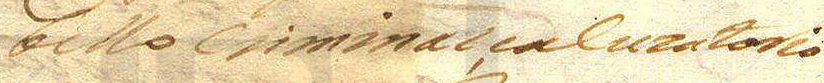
bello criminal, e acuzatorio
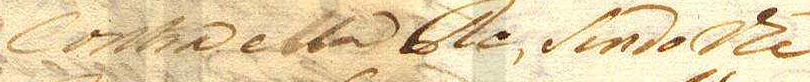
contra ella Re, sendo lhe
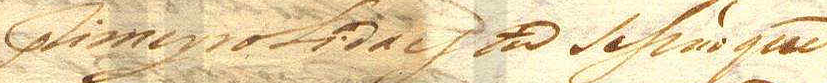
primeyro Lida esta sessaõ que
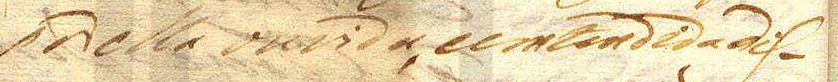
por ella ouvida, e emtendida dis
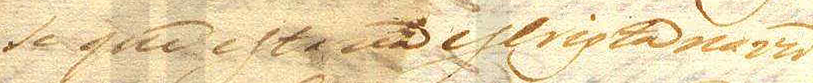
se que estaua escripta na ver
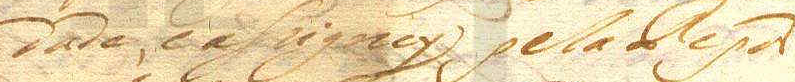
dade, e assigney pela Re por
